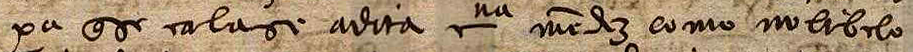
ꝑa q̄ se calase a dita cna mēdez como no libelo
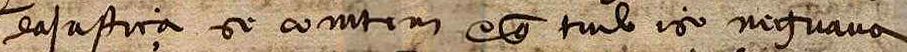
da Justiça se comtem e q̄ tudo iso neguaua
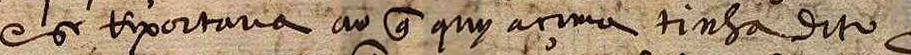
e se Reportaua ao q̄ quy acima tinha dito e
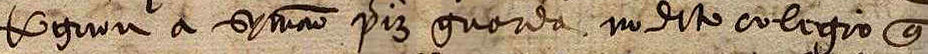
Roguou a symão pīz guarda no dito colegio q̄
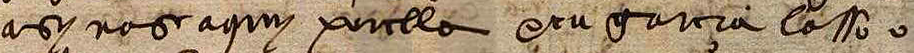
asynase aquy por ella e eu garcia lasso o
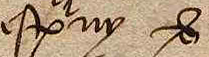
estpiuy
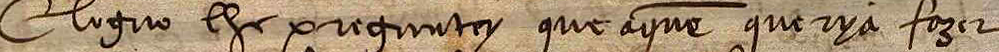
E loguo lhe preguntey que a quē querya fazer
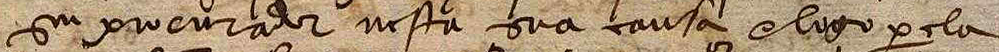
seu procurador nesta sua causa e logo ꝑ ela
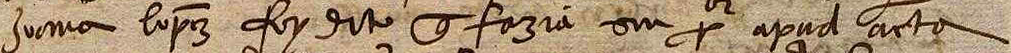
Joana lopez foy dito q̄ fazia seu ꝓor apud acta
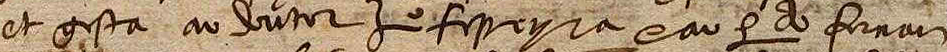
et gesta ao doutor Jo ferreyra e ao Ldo fernam
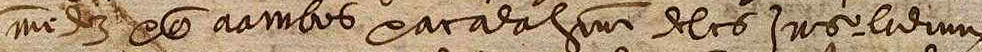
mēdez e q̄ a ambos e a cada hūu deles Jn solidum
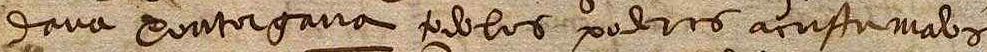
daua e outorgaua todolos poderes acustumados
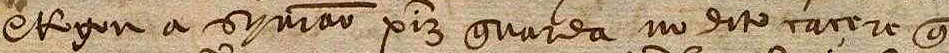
e Rogou a symão pīz guarda no dito cacere q̄
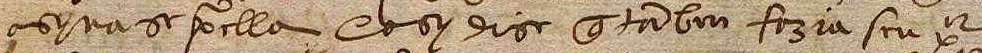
asynase p̄o ella e asy dise q̄ tābem fazia seu por
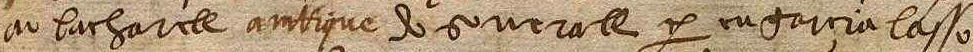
ao bacharell amRique do souerall cꝭ eu garcia lasso
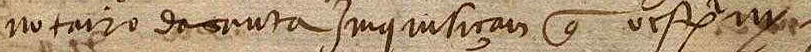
notairo da santa Jmquisiçam q̄ o estpiuy
